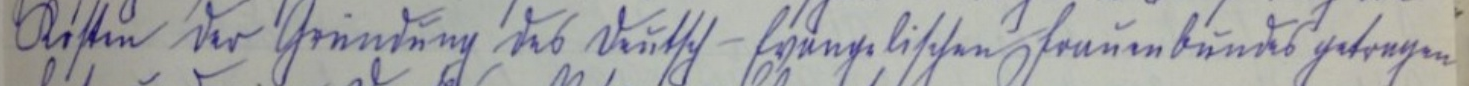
Kosten der Gründung des Deutsch-Evangelischen Frauenbundes getragen
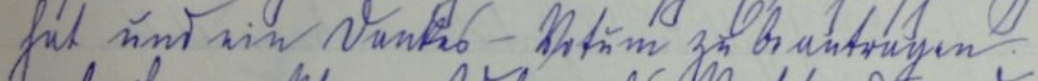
hat und ein Dankes-Votum zu beantragen.
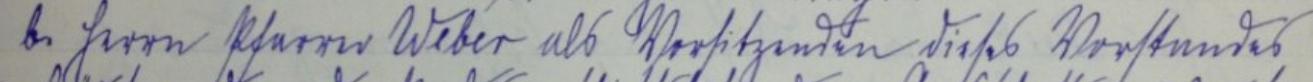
b. Herrn Pfarrer Weber als Vorsitzenden dieses Vorstandes
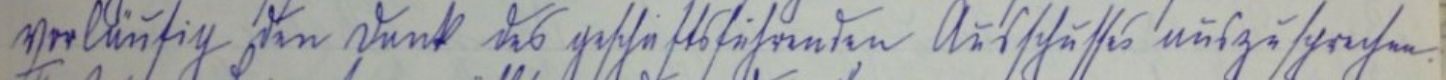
vorläufig den Dank des geschäftsführenden Ausschusses auszusprechen.
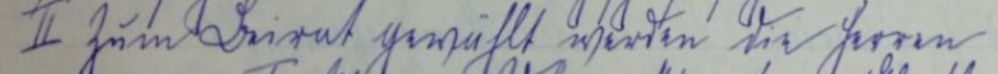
II. Zum Beirat gewählt werden die Herren
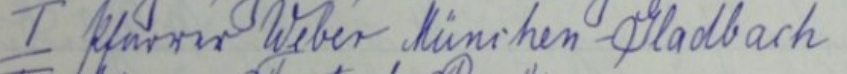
I. Pfarrer Weber, München-Gladbach
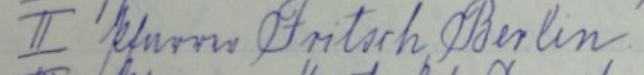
II. Pfarrer Fritsch, Berlin
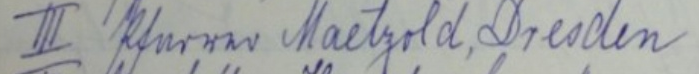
III. Pfarrer Mätzold, Dresden
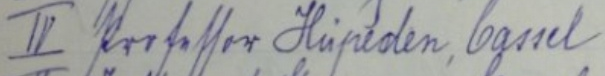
IV. Professor Hupeden, Cassel
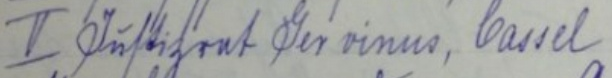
V. Jusitzrat Servius, Cassel
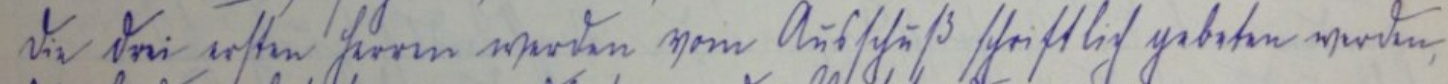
Die drei ersten Herren werden vom Ausschuß schriftlich gebeten werden,
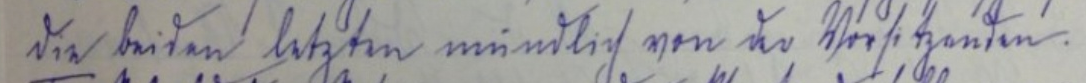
die beiden letzten mündlich von der Vorsitzenden.
